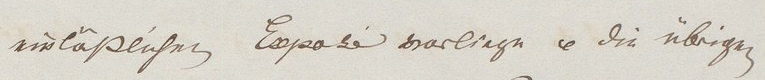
einläßlichen Expose vorliege & die übrigen
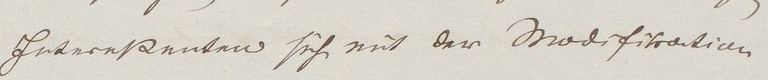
Intereßenten sich mit der Modifikation
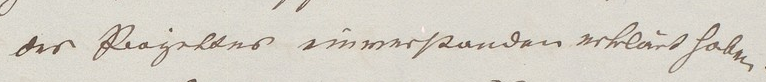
des Projektes einverstanden erklärt haben.
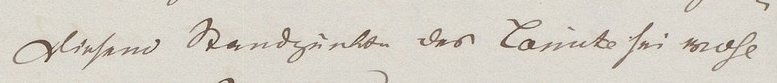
Diesem Standpunkte des Comite sei wohl
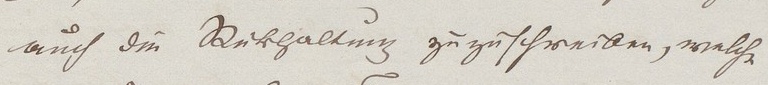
auch die Rükhaltung zuzuschreiben, welche
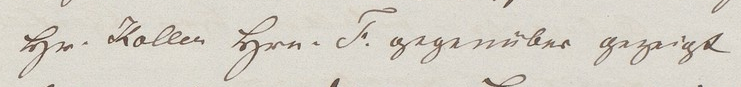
Hr. Koller Hrn. F. gegenüber gezeigt
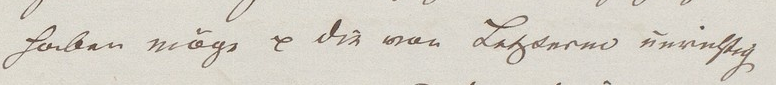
haben möge & die von Letzterm unrichtig
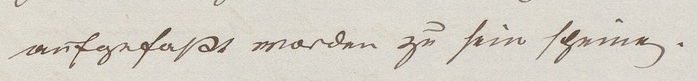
aufgefaßt worden zu sein scheine.
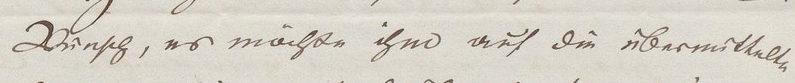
Wunsch, es möchte ihm auf die übermittelte
